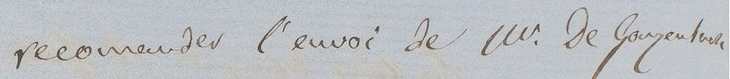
recomander l'envoi de MrDe Gonzenbach
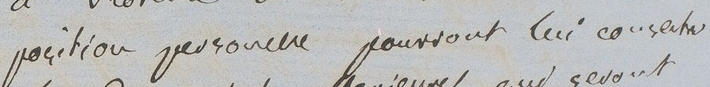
position personelle pourront lui consentir
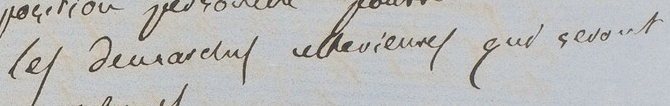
les demarches ulterieures qui seront
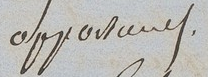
opportunes.
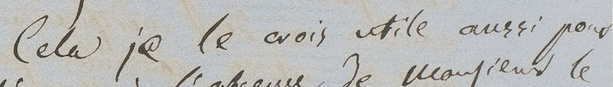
Cela je le crois utile aussi pour
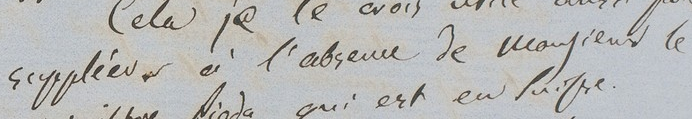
suppléer à l'absence de Monsieur le
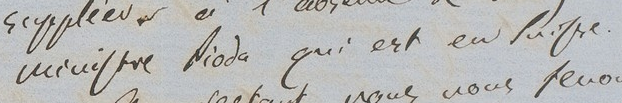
Ministre Pioda qui est en Suisse.
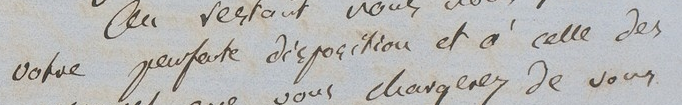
votre parfaite disposition et à celle des
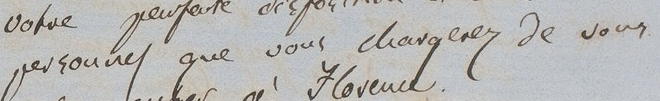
personnes que vous chargerez de vous
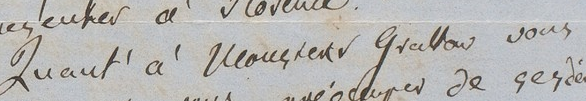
Quant à Monsieur Grattoni vous
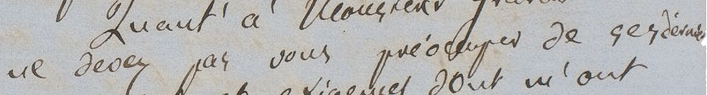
ne devez pas vous préoccuper de ses dérniers
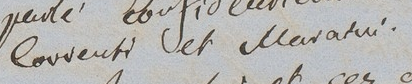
Correnti et Maraini.
